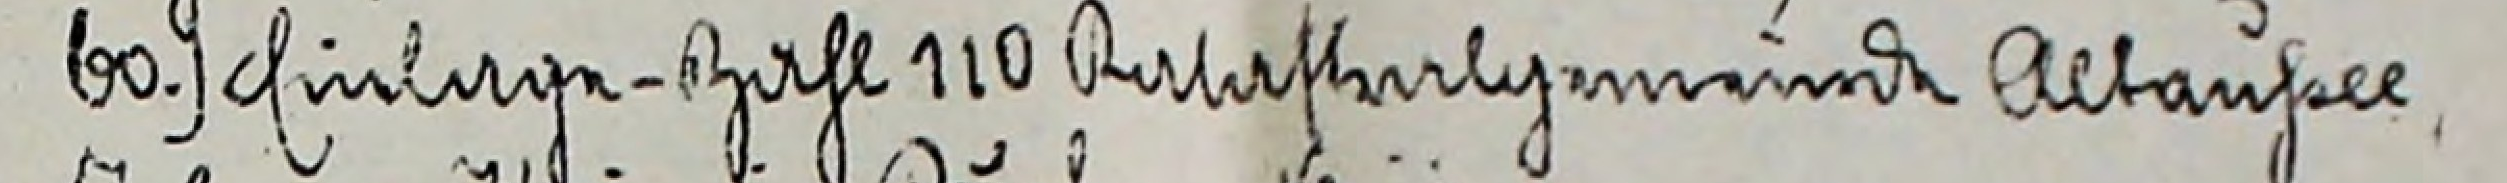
60.) Einlage - Zahl 110 Katastralgemeinde Altaussee,
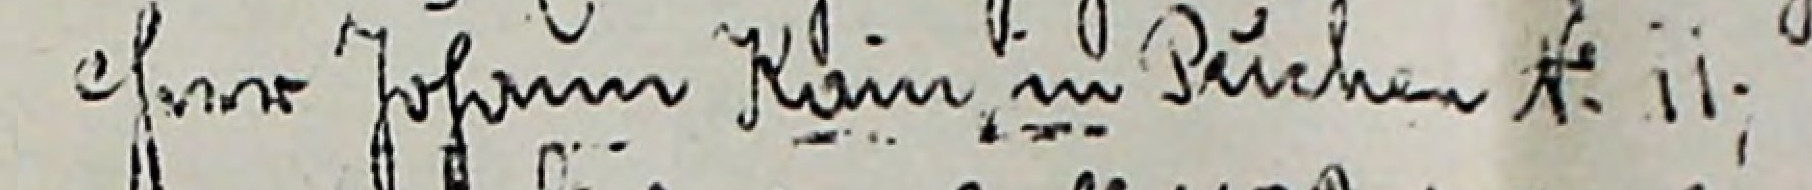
Herr Johann Kain, in Puchen No 11;
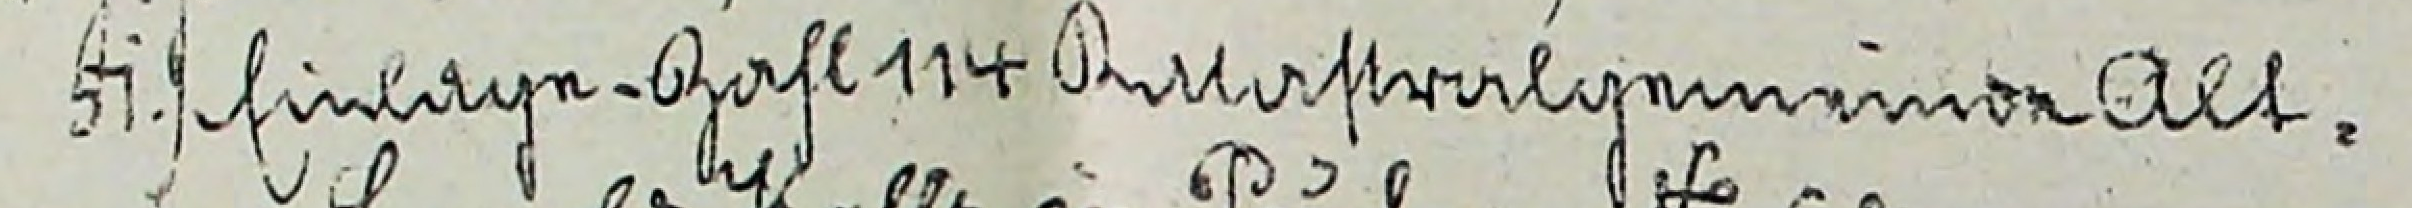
51.) Einlage - Zahl 114 Katastralgemeinde Alt=
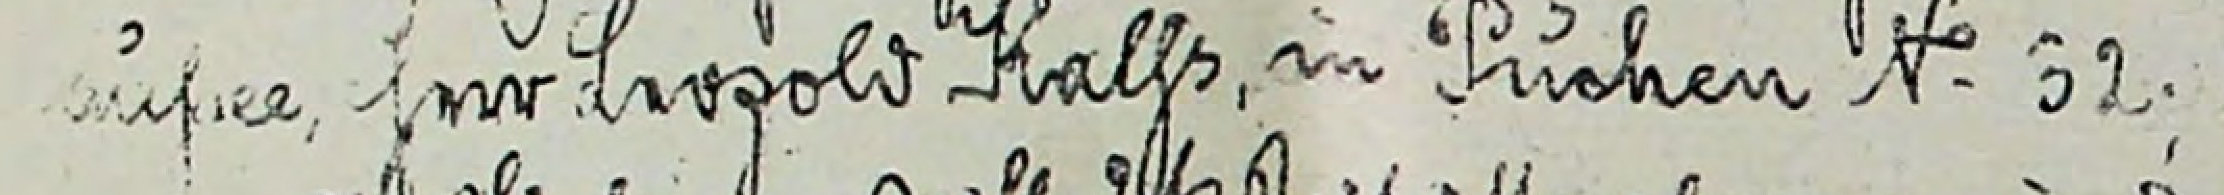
aussee, Herr Leopold Kalhs, in Puchen No 32;
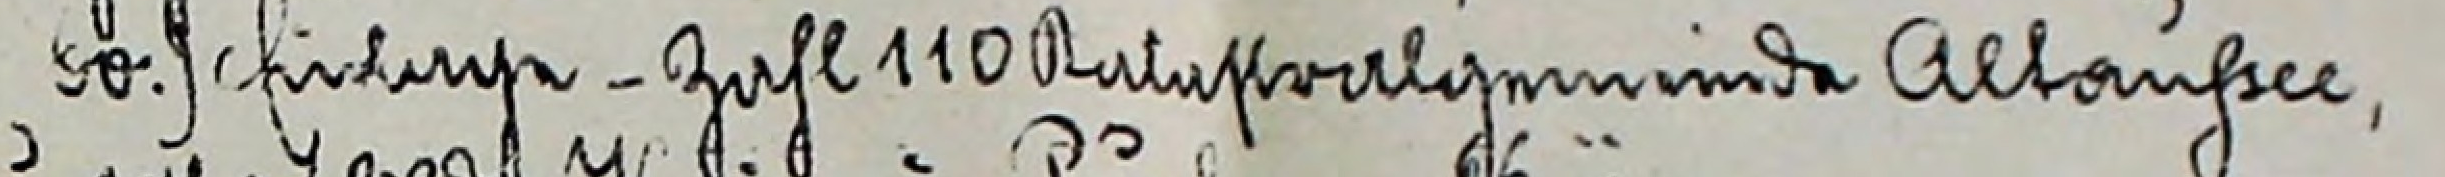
60.) Einlage - Zahl 110 Katastralgemeinde Altaussee,
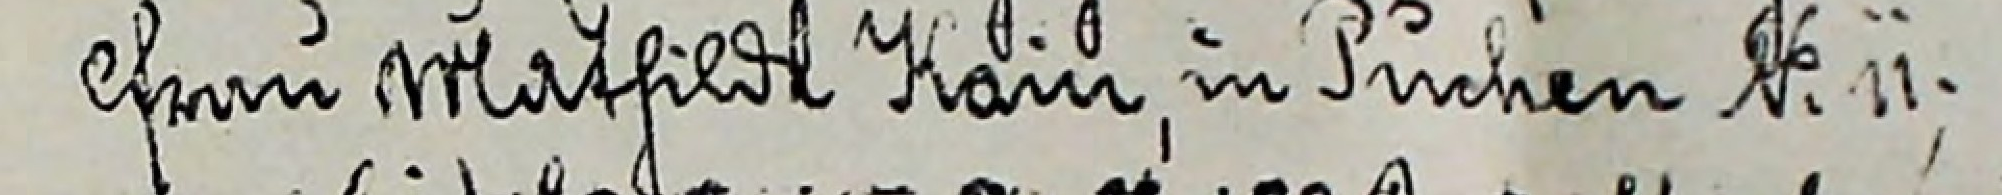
Frau Mathilde Kain, in Puchen No 11;
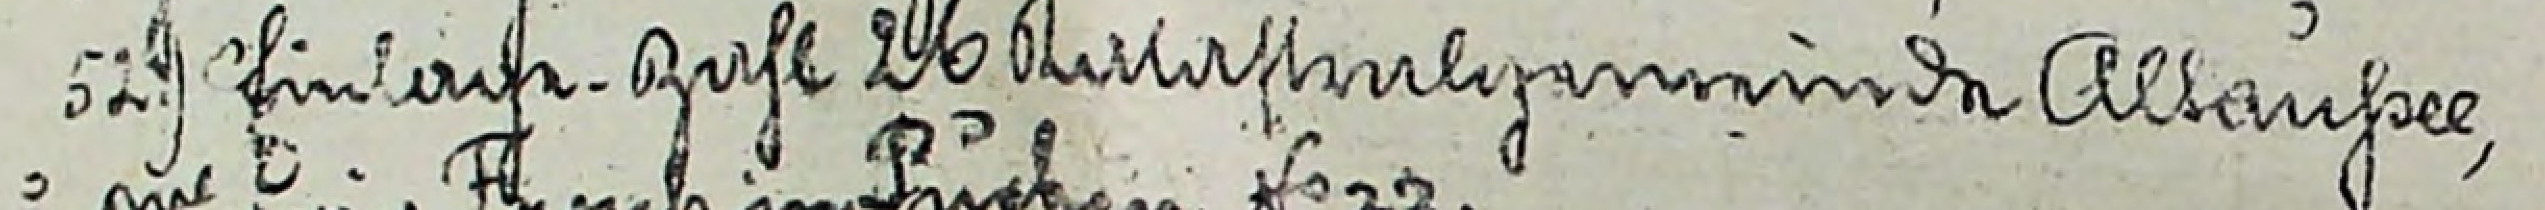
52.) Einlage - Zahl 26 Katastralgemeinde Altaussee,
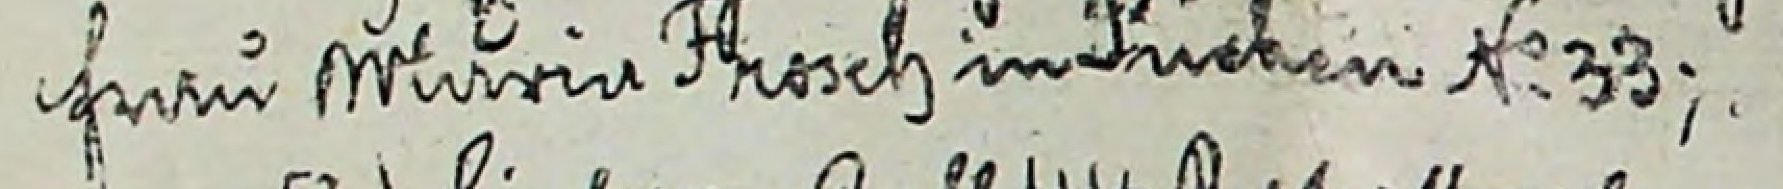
Frau Maria Frosch in Puchen No 33;
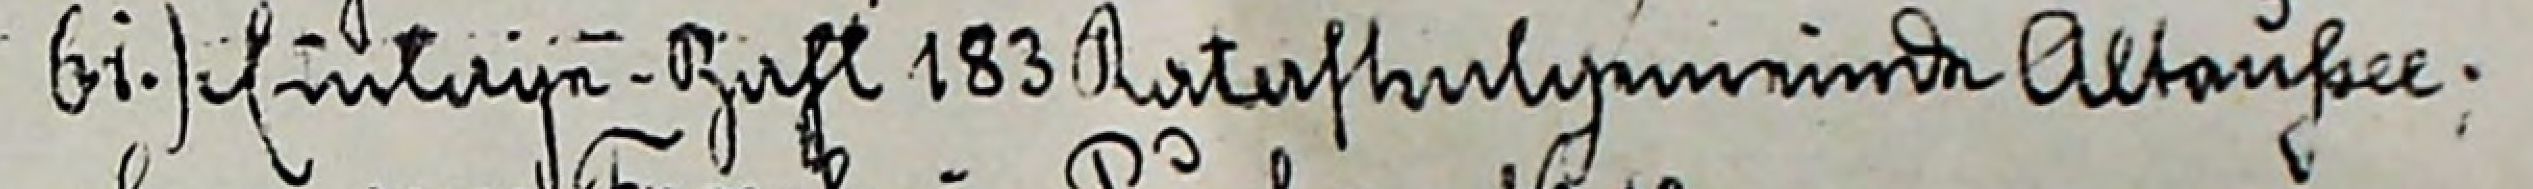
61.) Einlage - Zahl 183 Katastralgemeinde Altaussee,
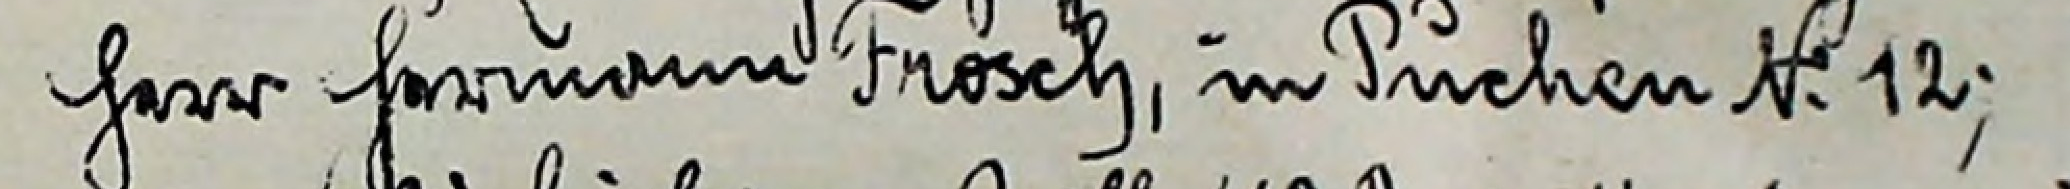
Herr Hermann Frosch, in Puchen No 12;
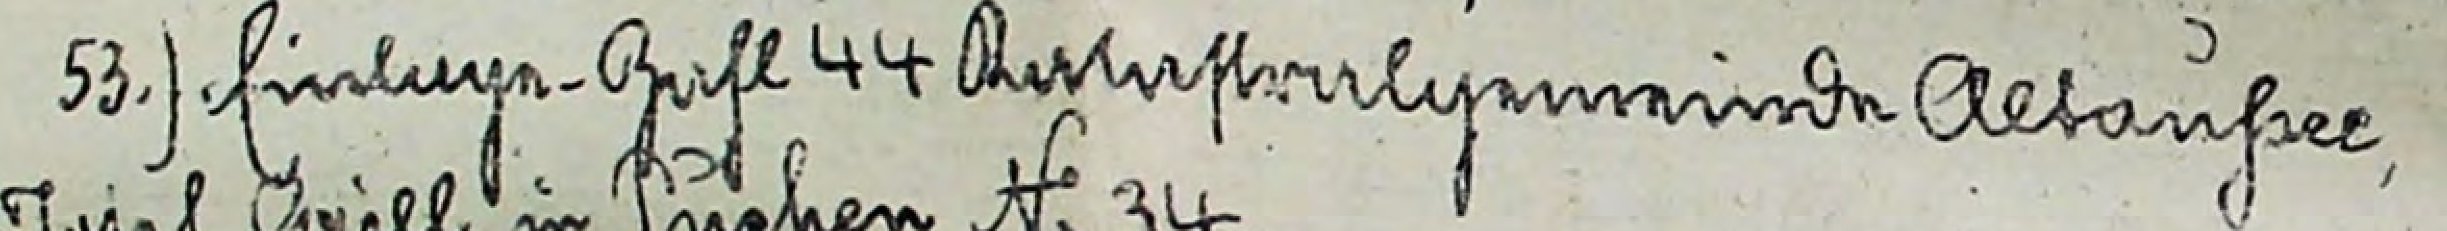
53.) Einlage - Zahl 44 Katastralgemeinde Altaussee,
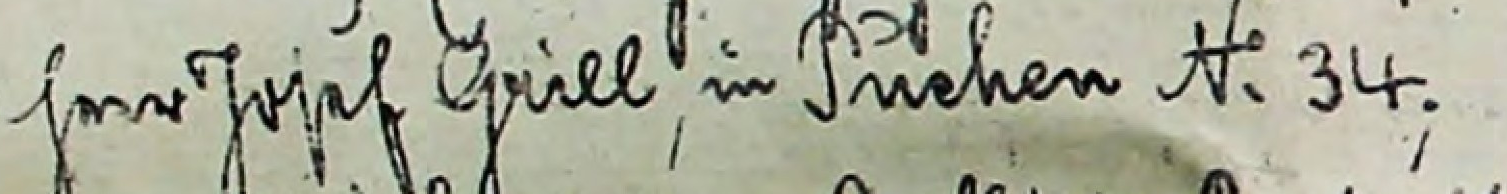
Herr Josef Grill, in Puchen No 34;
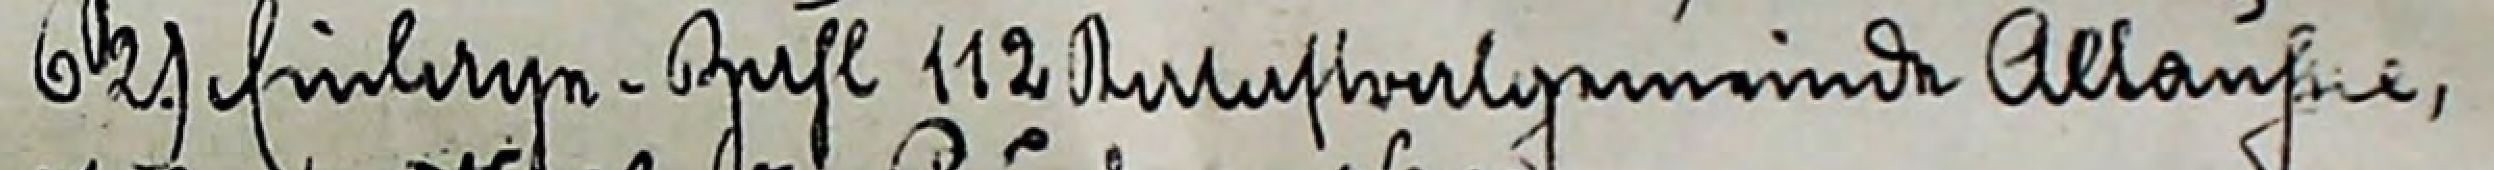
62.) Einlage - Zahl 112 Katastralgemeinde Altaussee,
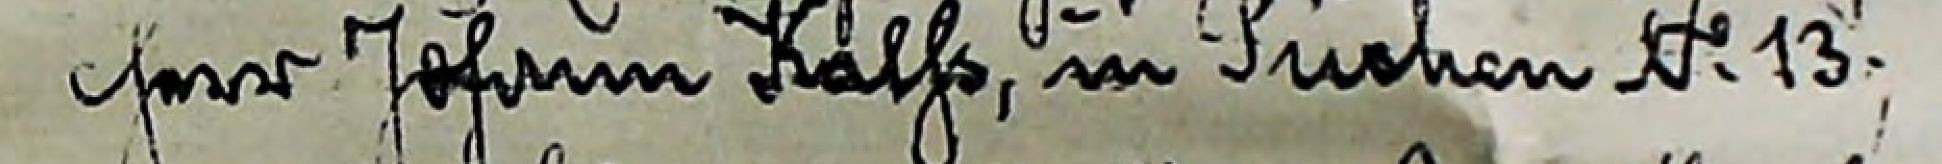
Herr Johann Kalhs, oin Puchen No 13;
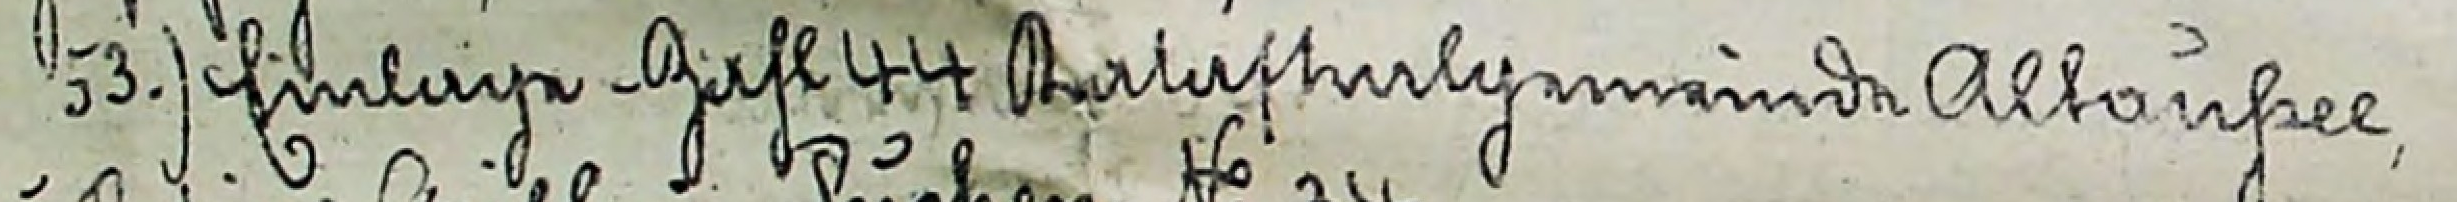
53.) Einlage - Zahl 44 Katastralgemeinde Altaussee,
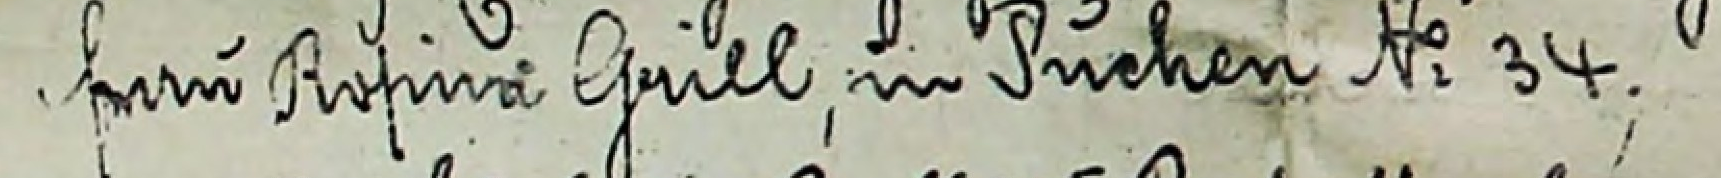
Frau Rosina Grill, in Puchen No 34;
